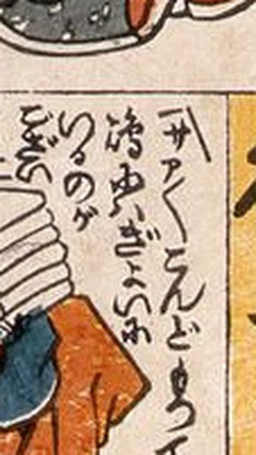島にはぎょいに
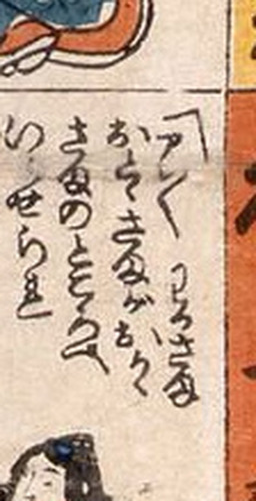おとヽさまがおかヽ
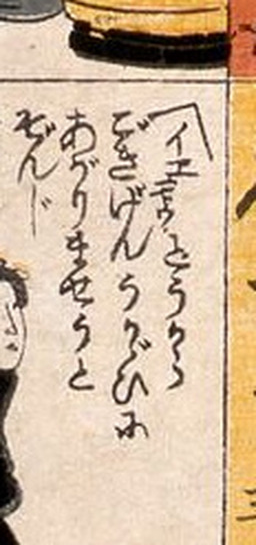ごきげんうかヾひに
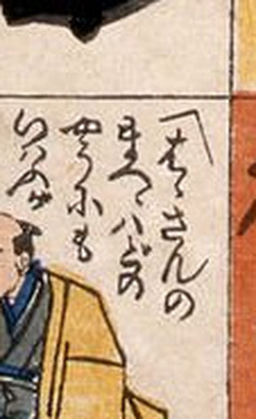まへゝはどの
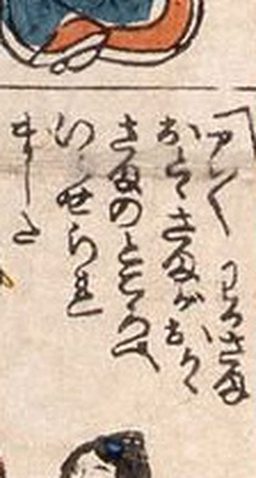さまのところへ
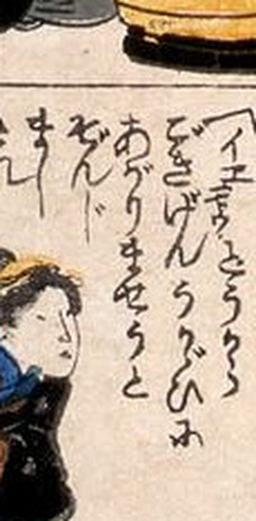あがりませうと
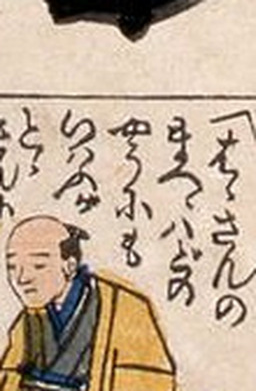やうにも
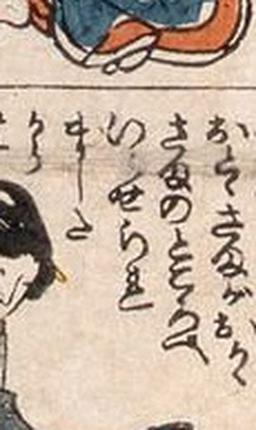いらせられ
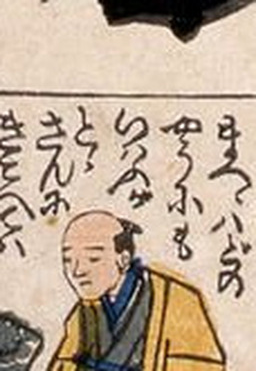いはふが
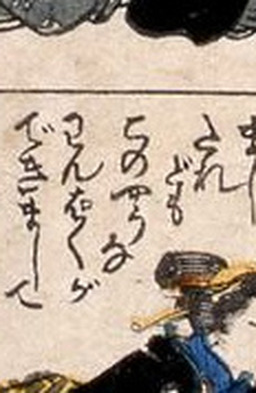このやうな
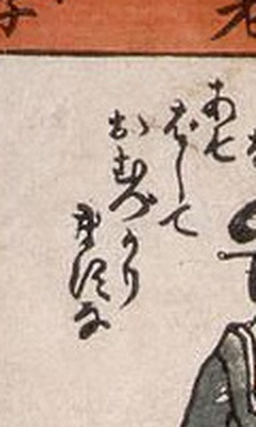おむづかり
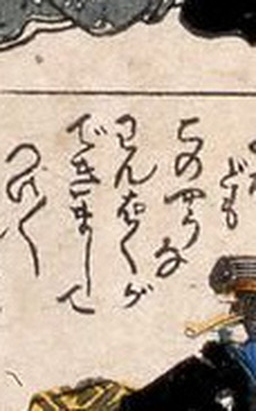わんぱくが
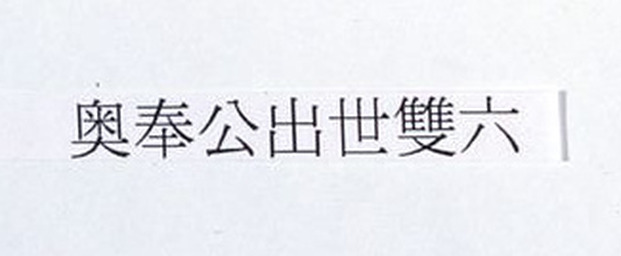奥奉公出世双六
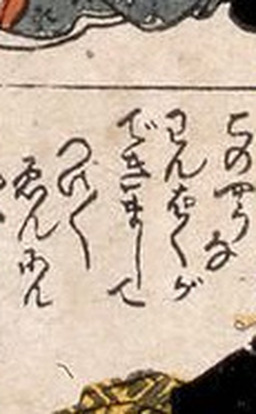できまして
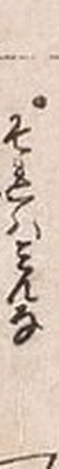それはみんな
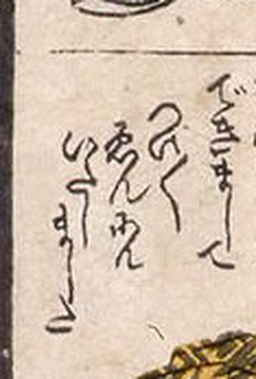ゑんにん
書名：奥奉公出世双六
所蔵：東京学芸大学教育コンテンツアーカイブ
